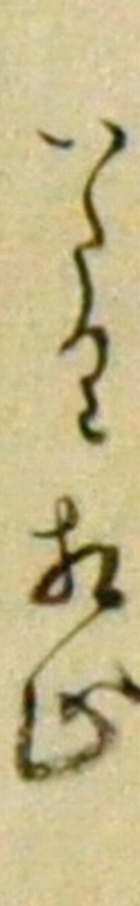いたり相止
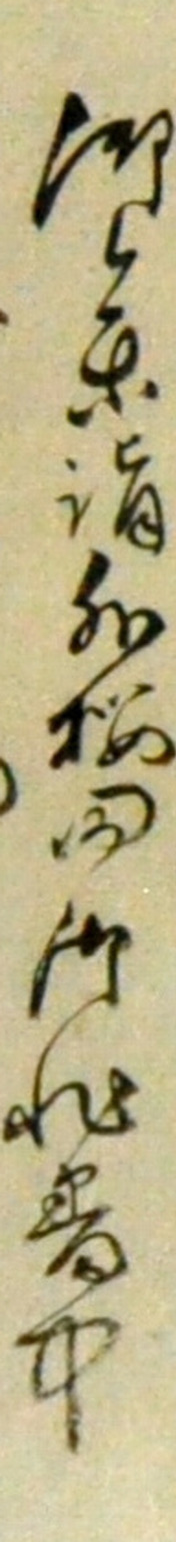御参詣外桜田御当番中

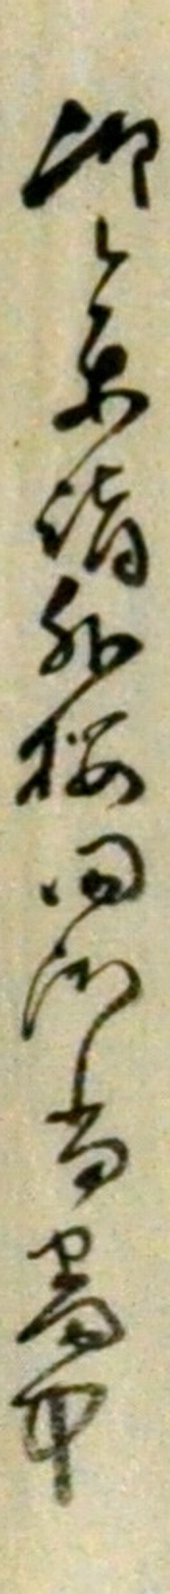御参詣外桜田御非番中
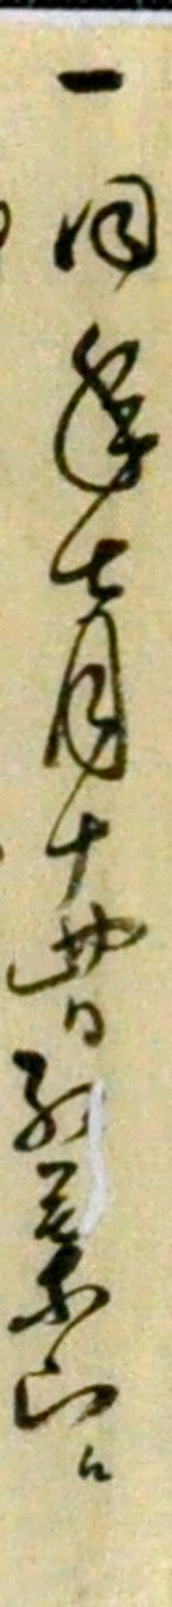一同年七月十四日紅葉山江
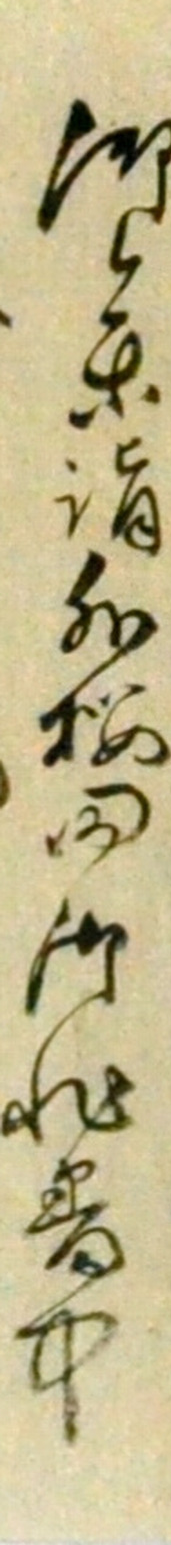御参詣外桜田御非番中
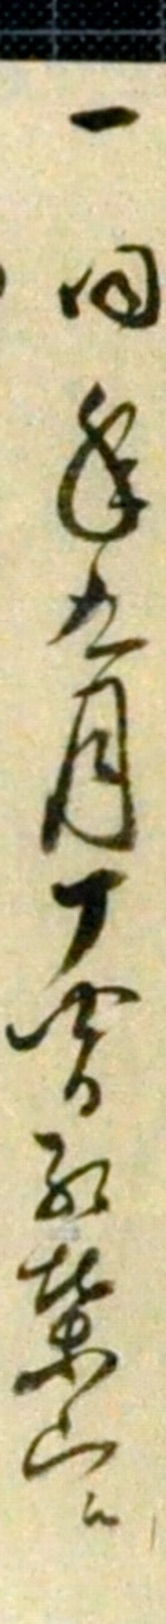一同年九月十四日紅葉山江
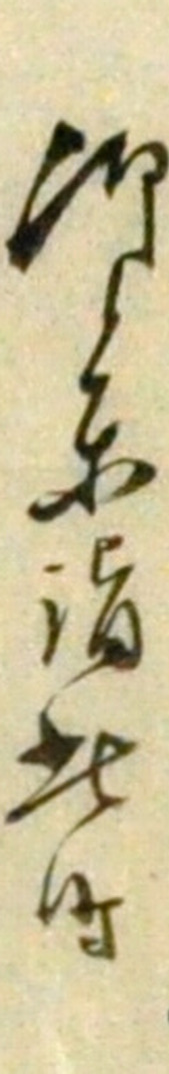御参詣此時
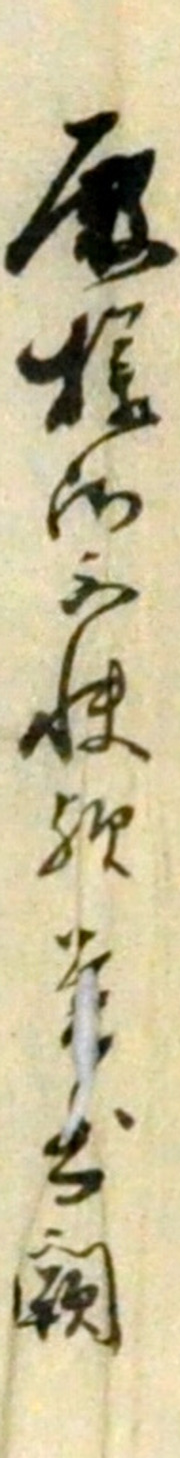殿様御不快歟出闕
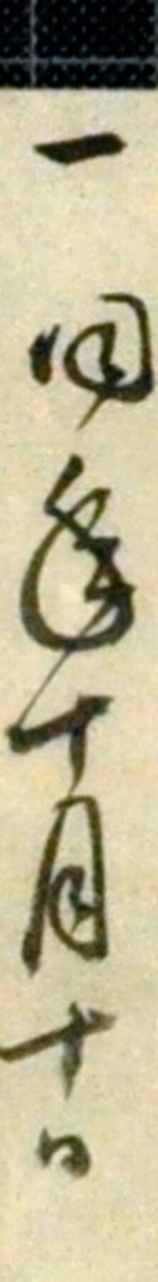一同年十月十日
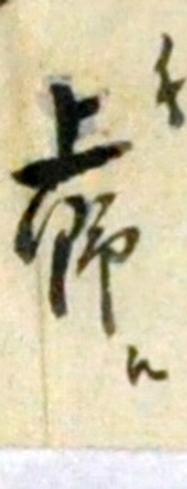上野江
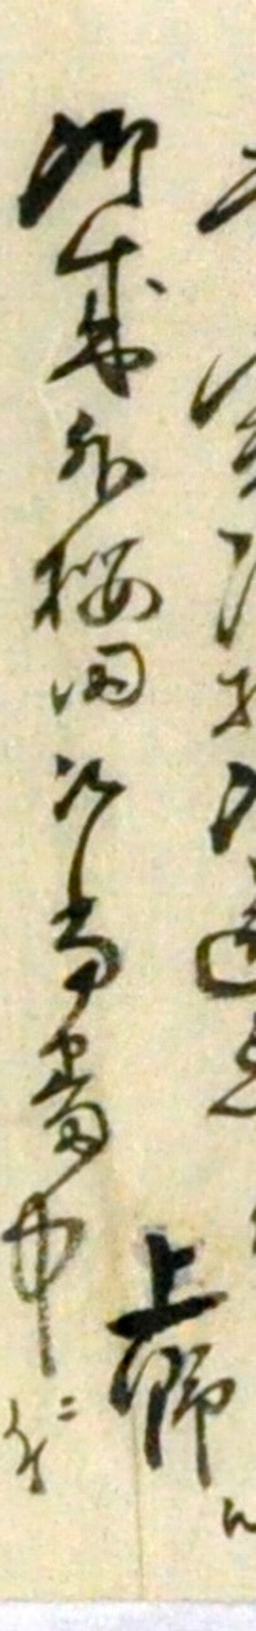御成外桜田御当番中ニ付
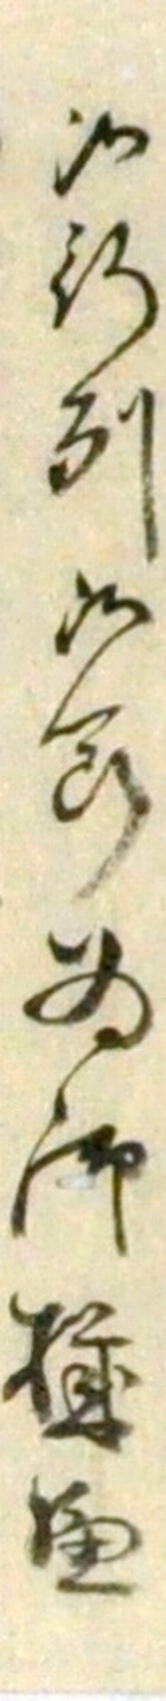御行列御断為御機嫌
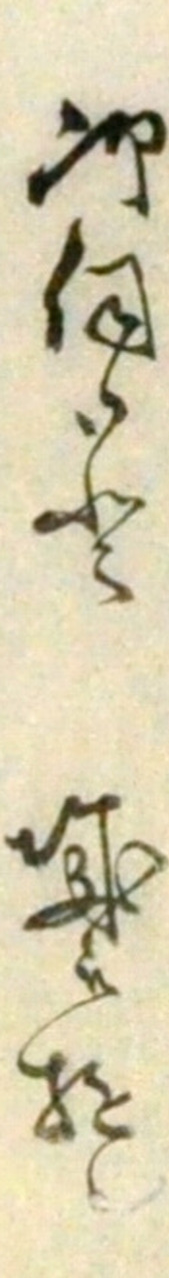御伺御登城被遊候
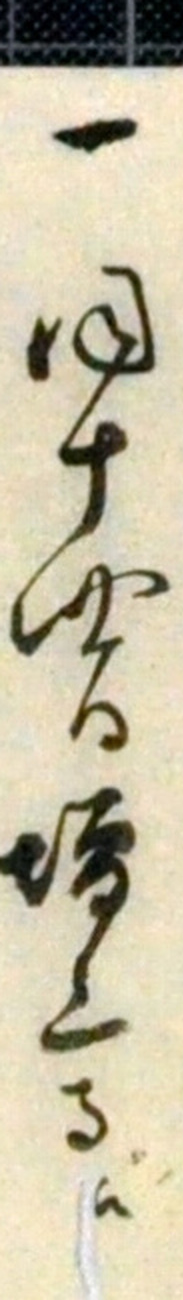一同十四日増上寺江
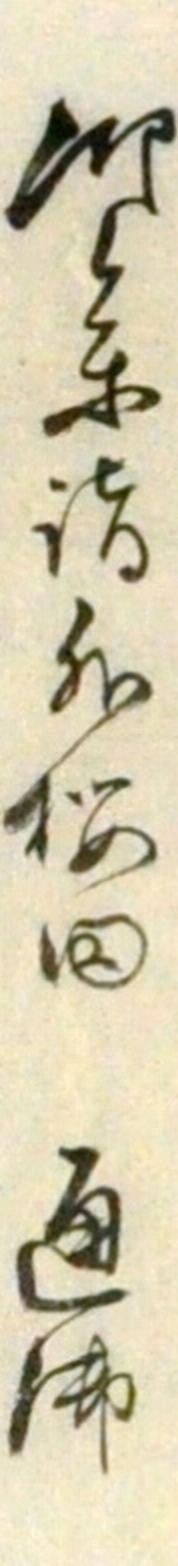御参詣外桜田通御
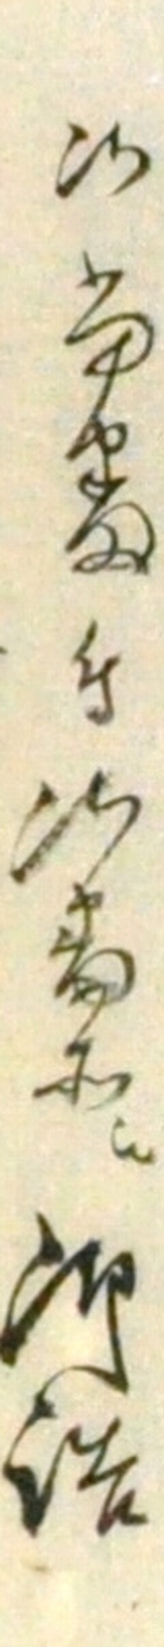御当番付御番所江御詰
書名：覚
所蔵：伊那市立高遠町図書館・合同会社AMANE
